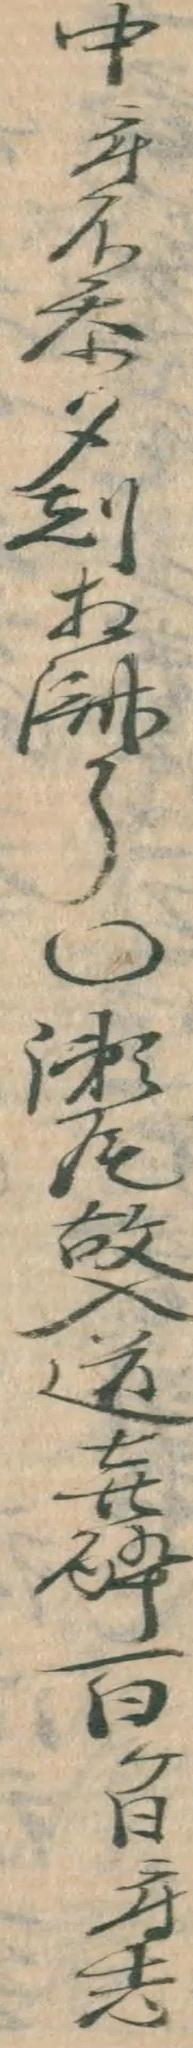中ニ付不参夕刻相済了○瀬尾故入道喜砕百ケ日ニ付老志
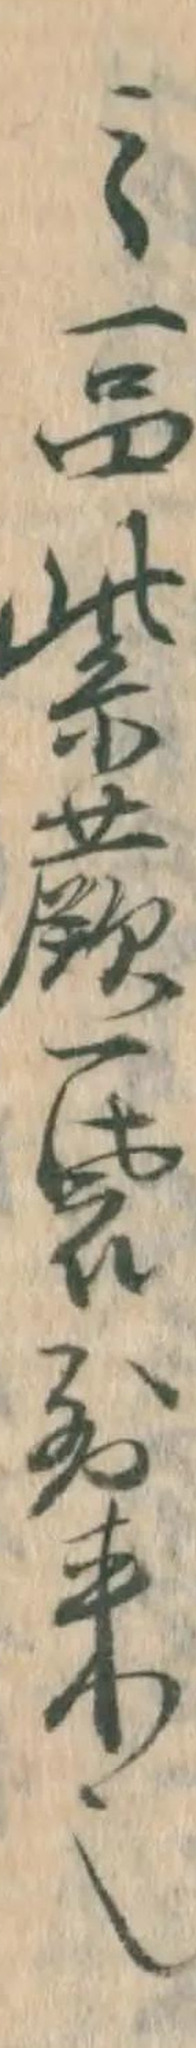之品紫蕨一袋到来也
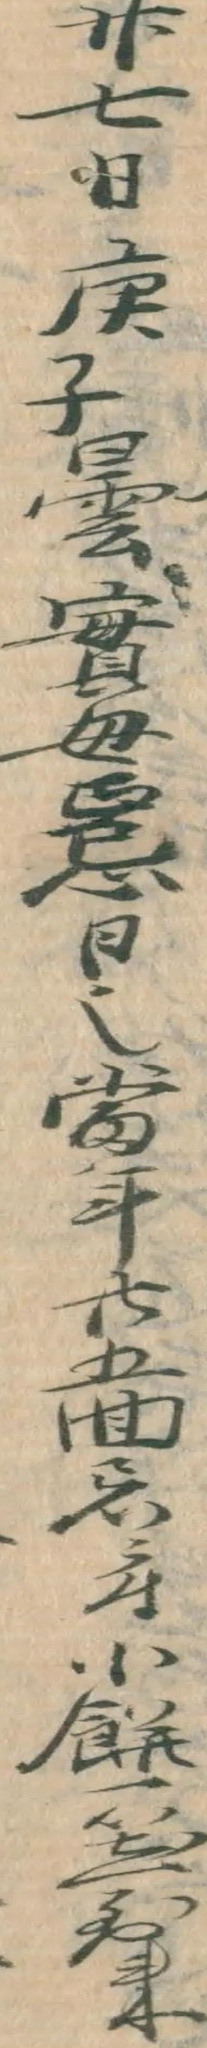廿七日庚子曇實母忌日之當年廿五回忌ニ付小餅盆到来
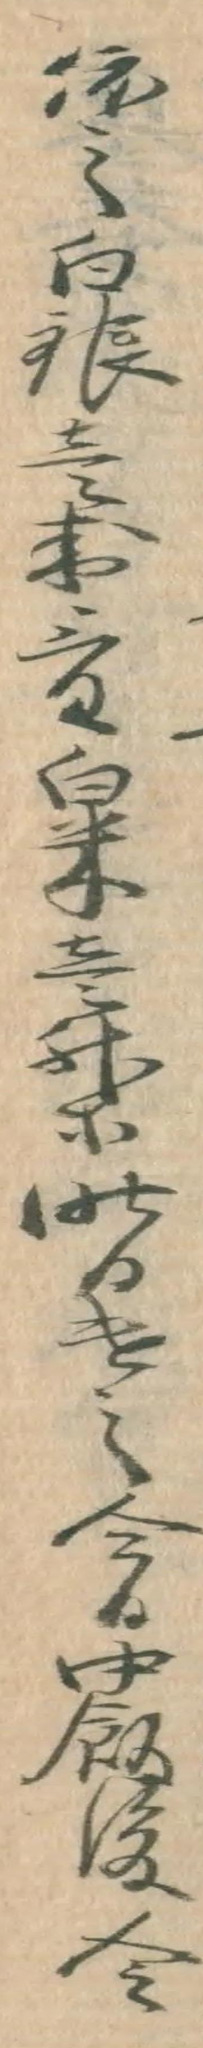依之白銀壱本三匁白米壱升昨日遣之今日中飯後令

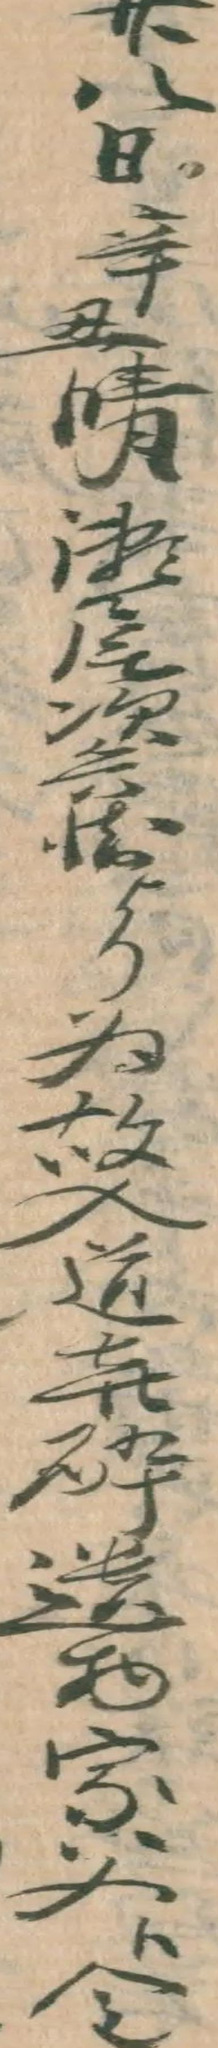廿八日辛丑晴瀬尾次兵衛より為故入道喜砕造物家父え金
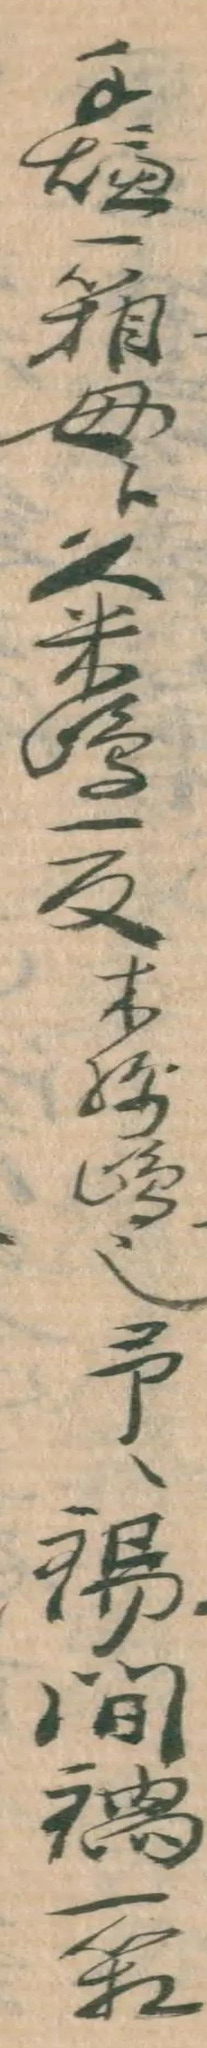手塩一箱母え久米島一反木綿嶋也予ヘ福間鍋一箱
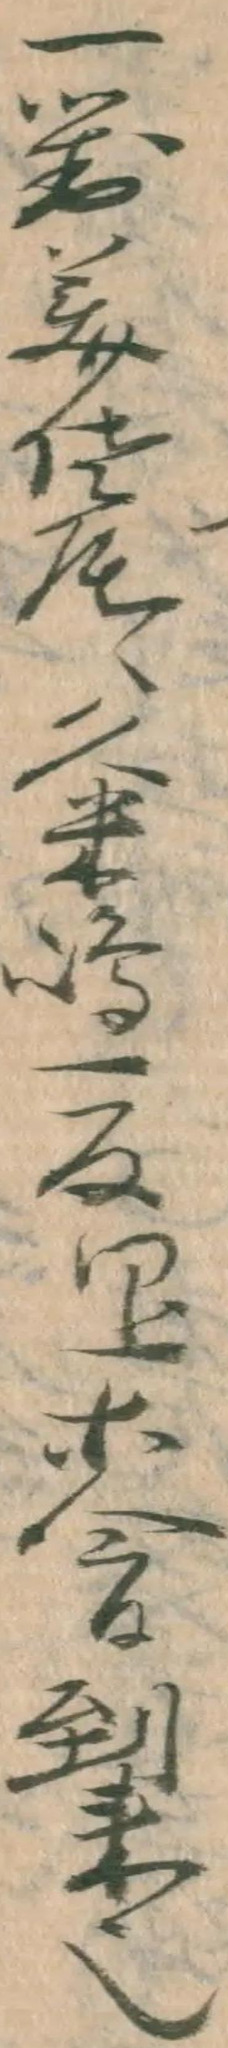一對美佐尾へ久米嶋一反同上等今日到来也
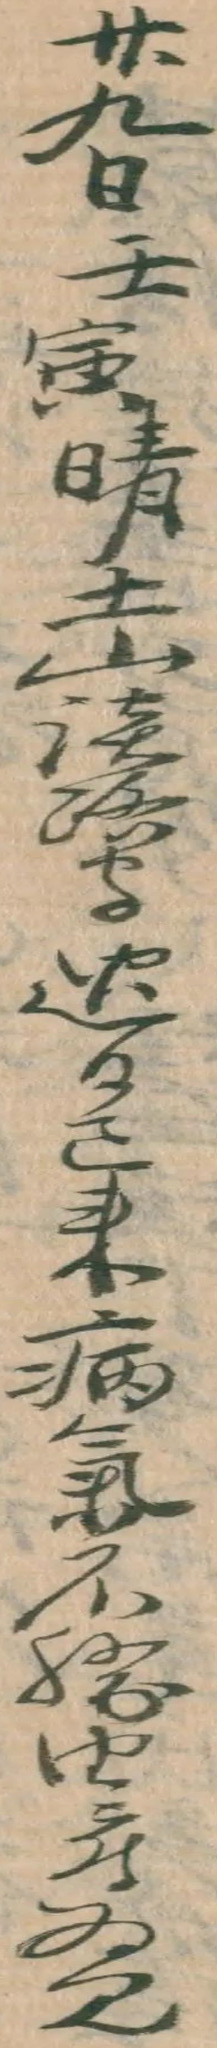廿九日壬寅晴土山淡路守過日已来病気不勝由ニ付為見
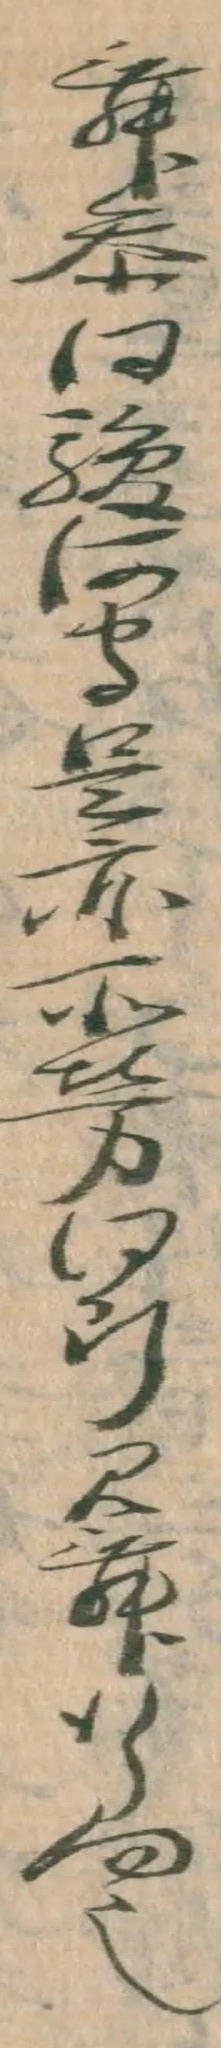舞参同駿河守是亦所労同断見舞行向也
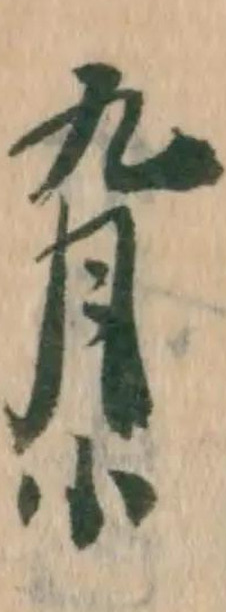九月小
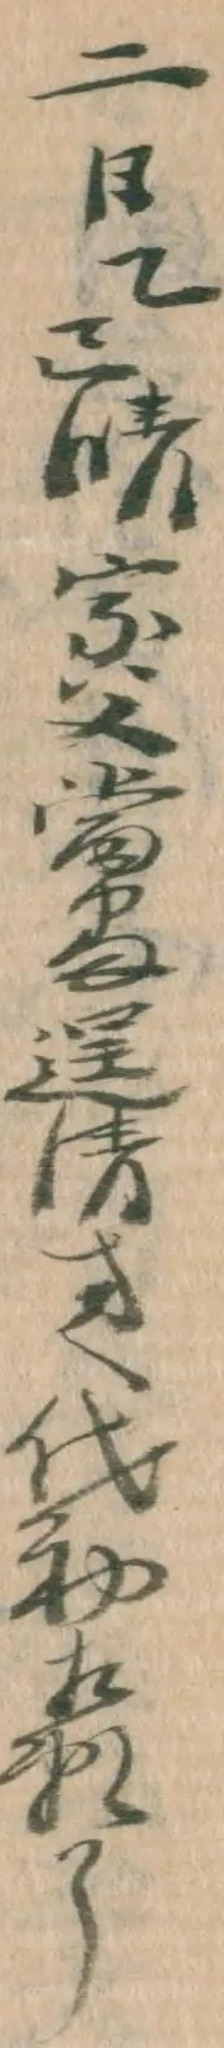二日乙巳晴家父當番逞清方へ代勤相頼了
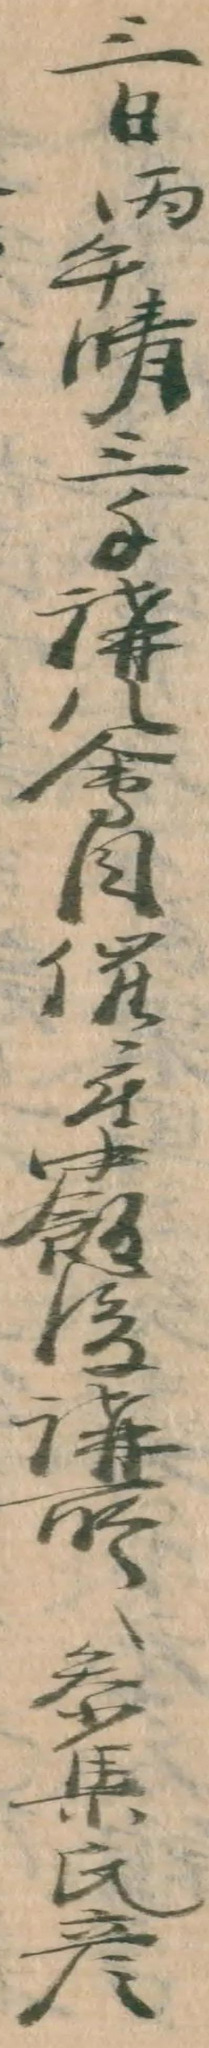三日丙午晴三手講八會目催ニ付中飯後講所へ参集氏彦
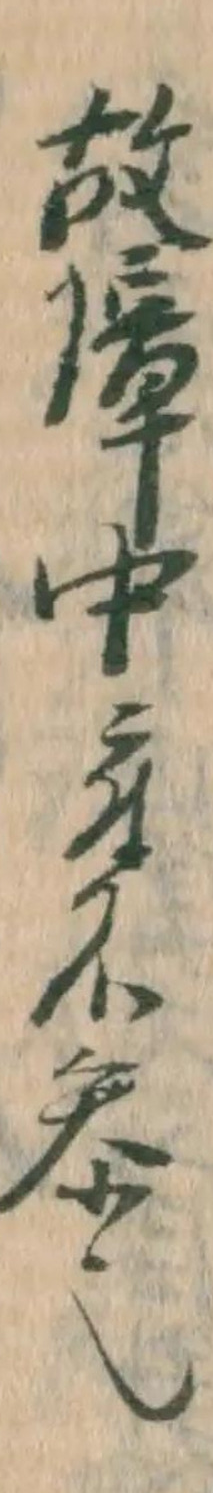故障中ニ付不参也
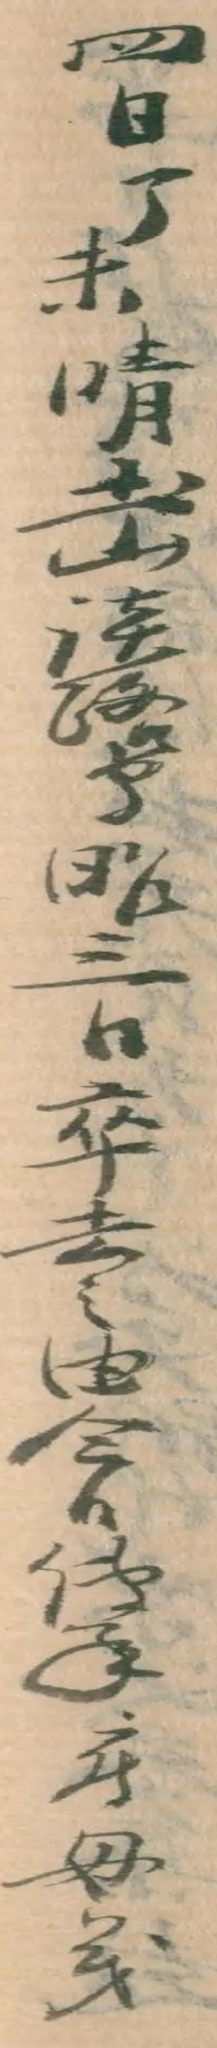四日丁未晴土山淡路守昨三日卒去之由今日傳承ニ付母義
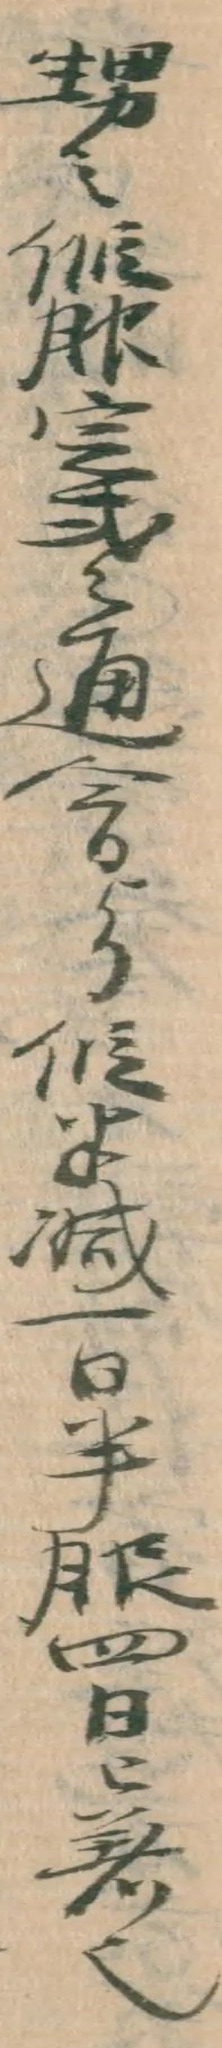甥之段服定式之通今日より仮半減一日半服四日被着也
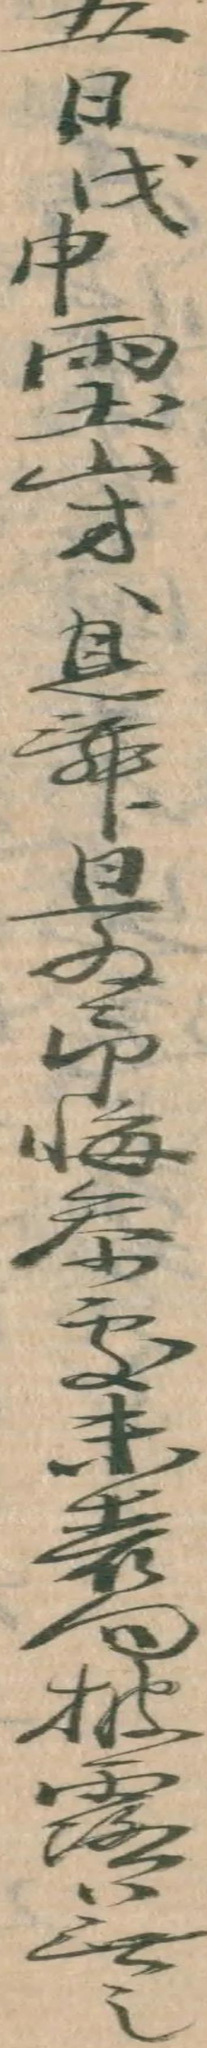五日戊申雨土山方へ見舞且為予悔参處未表向披露ハ無之
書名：賀茂社記録. 第65冊
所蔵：国立国会図書館 National Diet Library, JAPAN
